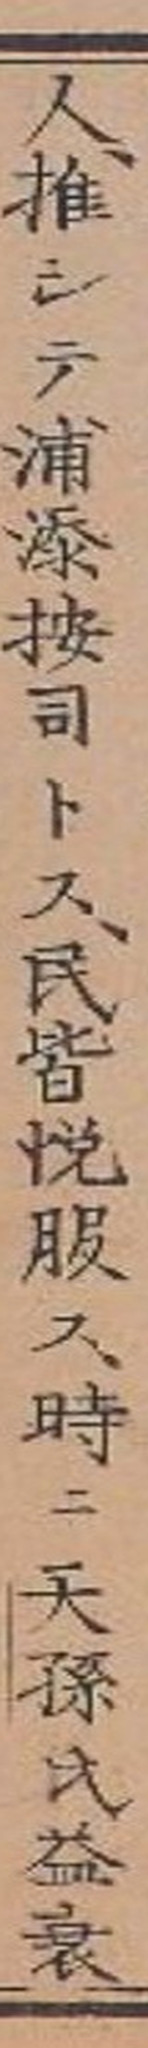人、推シテ、浦添按司トス、民皆悦服ス、時ニ天孫氏益衰
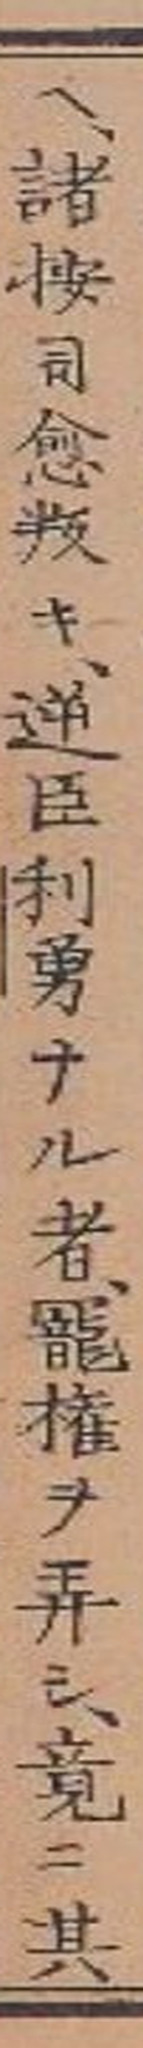ヘ、諸按司愈叛キ、逆臣利勇ナル者、寵権ヲ弄シ、竟ニ其

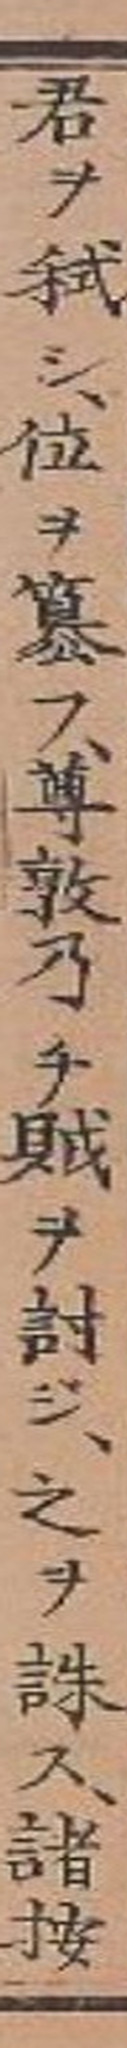君ヲ弑シ、位ヲ簒フ、尊敦乃チ賊ヲ討ジ、之ヲ誅ス、諸按
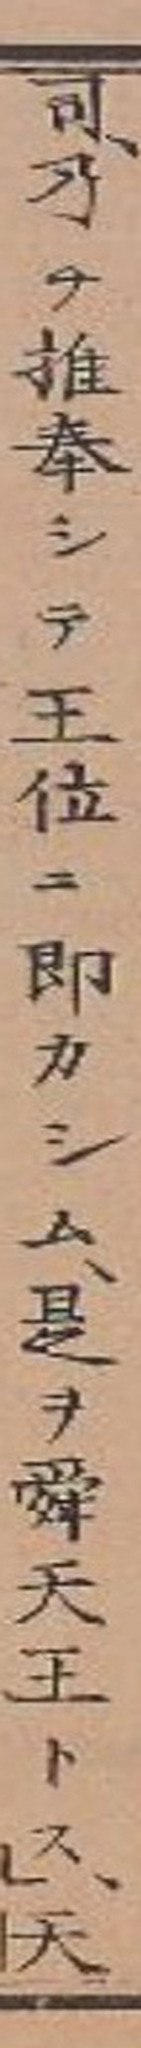司、乃チ推奉シテ王位ニ即カシム、是ヲ舜天王トス、」天
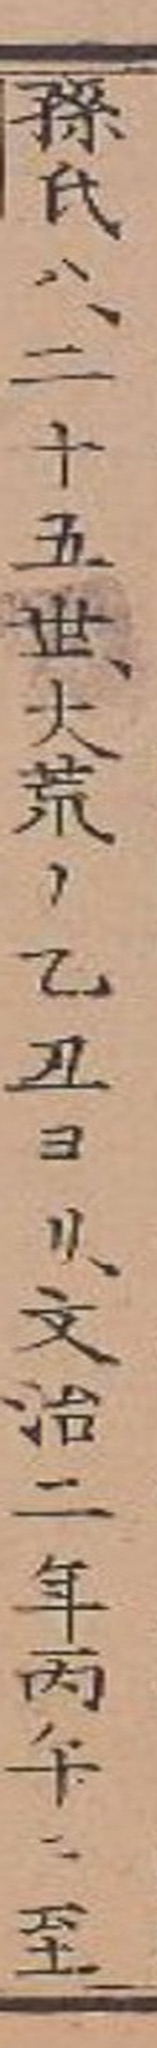孫氏ハ、二十五世、大荒ノ乙丑ヨリ、文治二年丙午ニ至
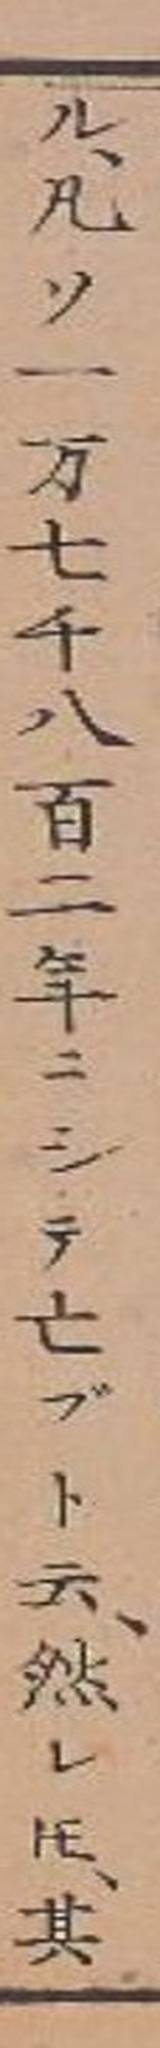ル、凡ソ一万七千八百二年ニシテ亡ブト云、然レトモ、其
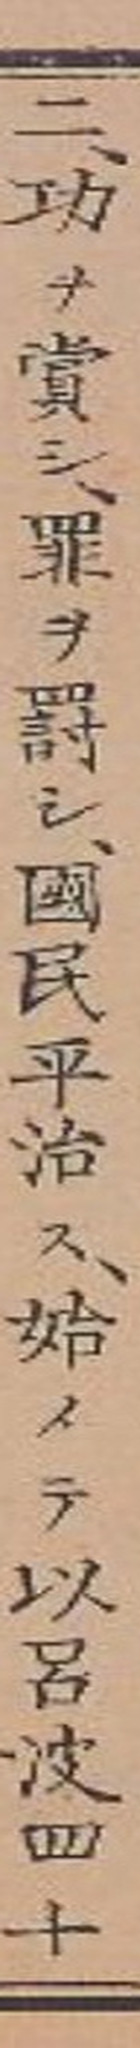二、功ヲ賞シ、罪ヲ罸シ、国民平治ス、始メテ以呂波四十
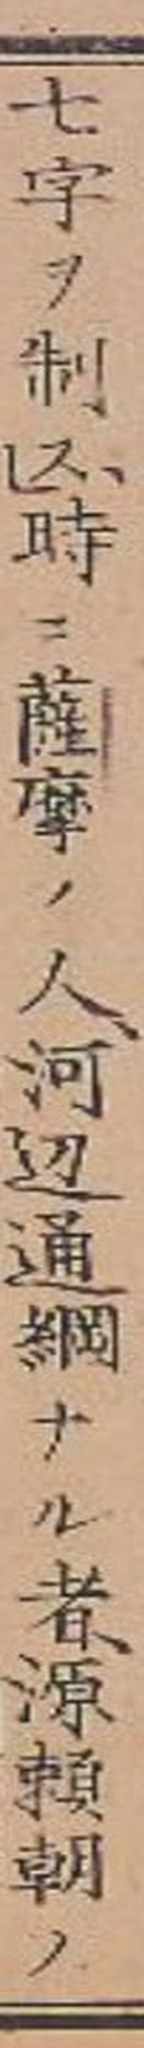七字ヲ制ス、」時ニ薩摩ノ人、河辺通綱ナル者、源頼朝ノ
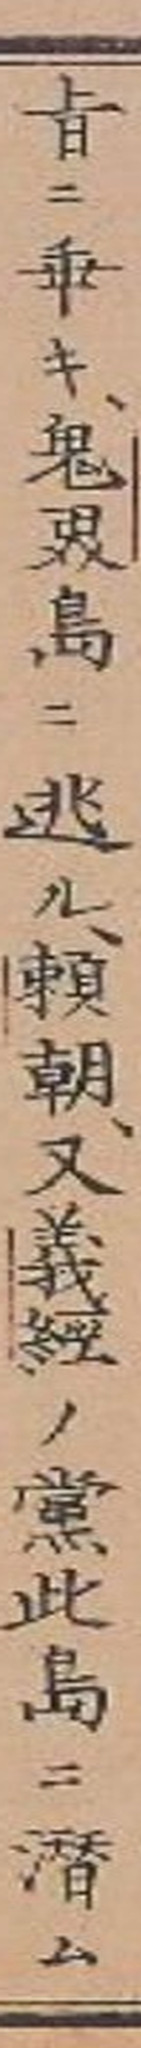旨ニ乖キ、鬼界島ニ逃ル、頼朝、又義経ノ党此島ニ潜ム
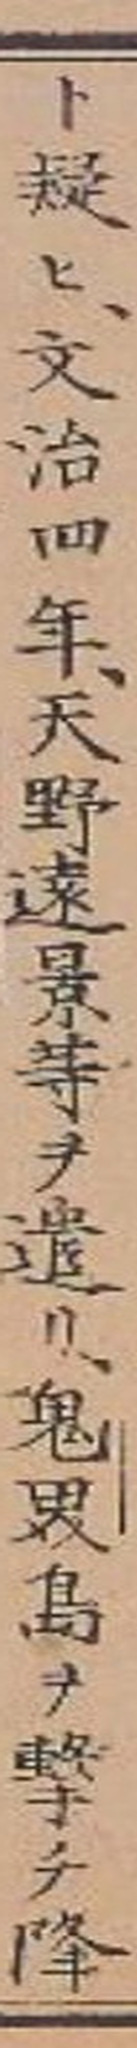ト疑ヒ、文治四年、天野遠景ヲ遣リ、鬼界島ヲ撃チ降
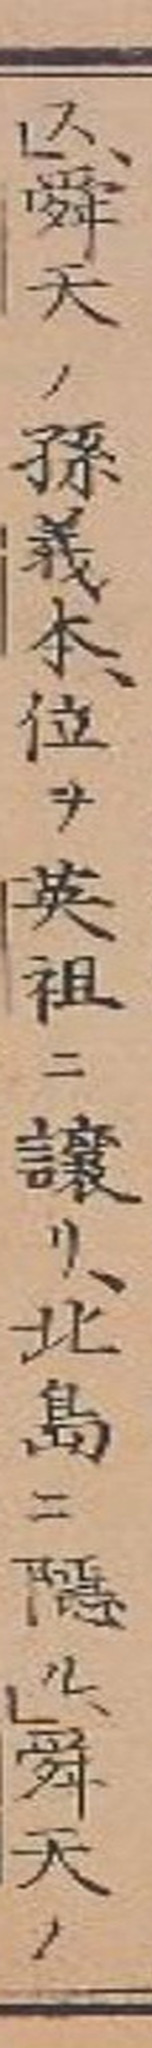ス、」舜天ノ孫義本、位ヲ英祖ニ譲リ、北島ニ隠ル、」天ノ
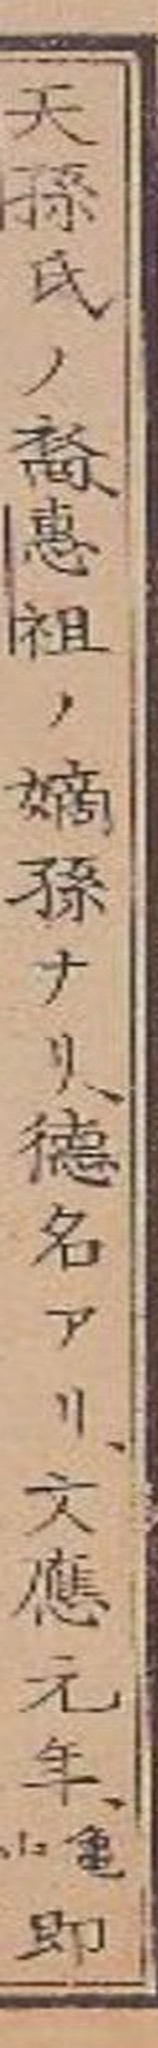天孫氏ノ裔、恵祖ノ嫡孫ナリ、徳名アリ、文応元年、亀山即
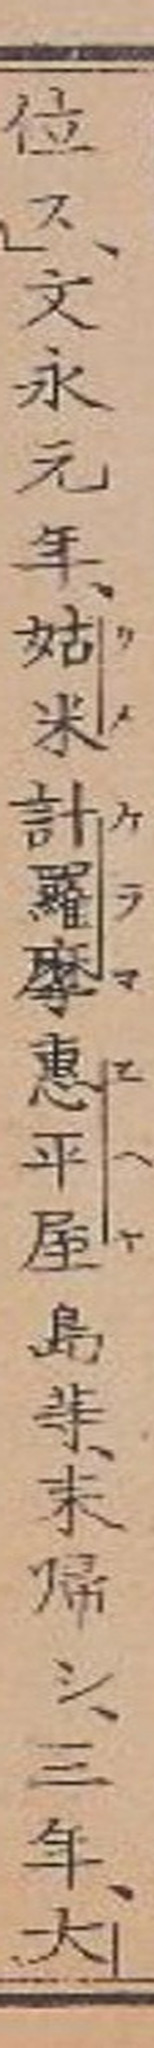位ス、」文永元年、姑米計羅摩恵平屋島等、来帰シ、三年、大
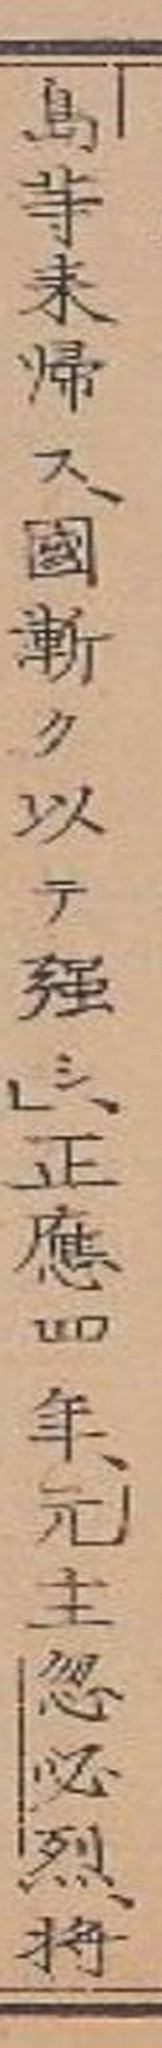島等来帰ス、国漸ク以テ強シ、」正応四年、元主忽必烈、将
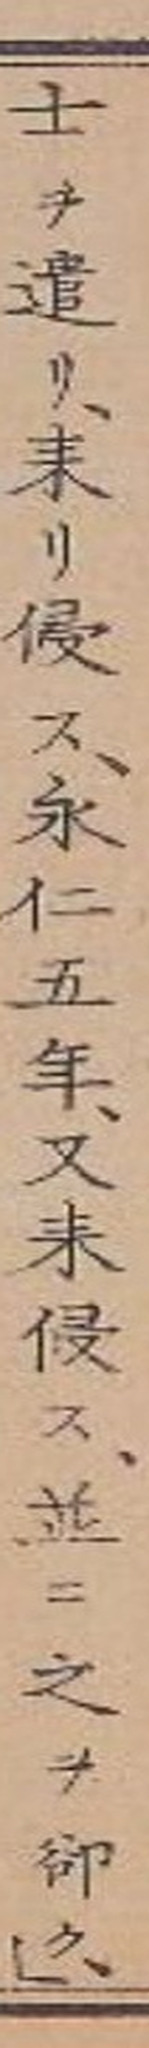士ヲ遣リ、来リ侵ス、永仁五年、又来侵ス、並ニ之ヲ却ク、」
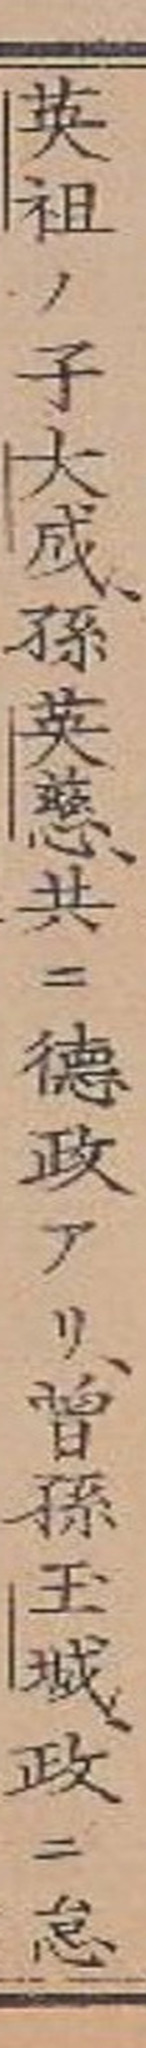英祖ノ子大成、孫英慈、共ニ徳政アリ、曾孫玉城、政ニ怠
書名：琉球新誌 巻上
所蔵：University of the Ryukyus Library
